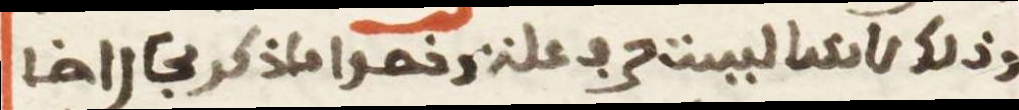وذلك لانها ليستحرف علة وخصوا بحال اضا
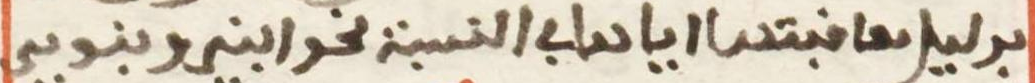بدليل معاقبتها إياها في النسبة نحو ابني وبنو ابني
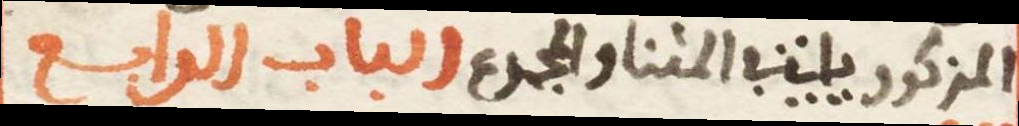المذكور في المثنى والمجوع الباب الرابع
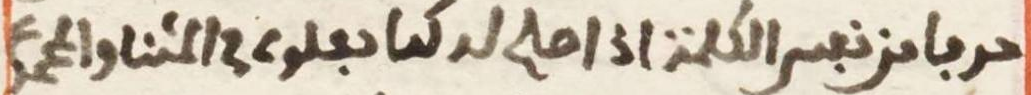حرفا من نفس الكلمة اذا صلح كما جعلوه في المثنا والمجموع
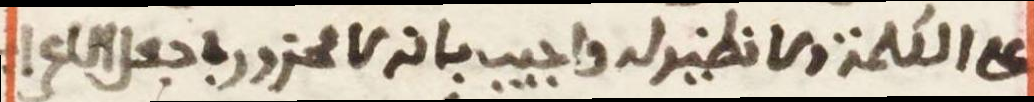على الكلمة ولا نظير له واجيب بانه لا محذور في جعل الاعراب
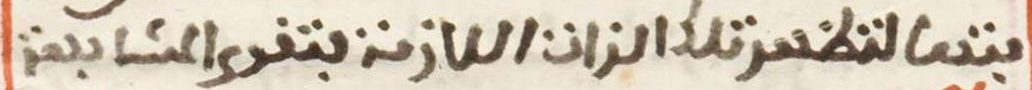فتها لتظهر تلك الذات اللازمة فتقوى المشابهة
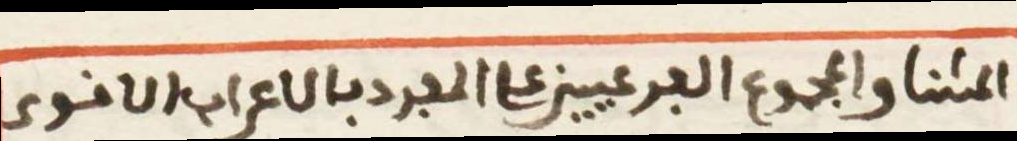المثنى والمجموع الفرعيين على المفرد بالاعراب الاقوى
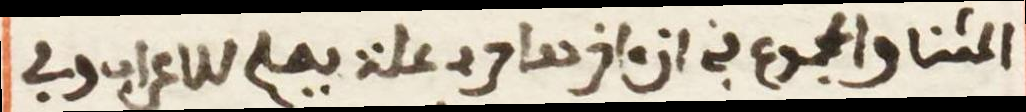المثنى والمجموع في ان ءاخرها حرف علة يصلح وفي
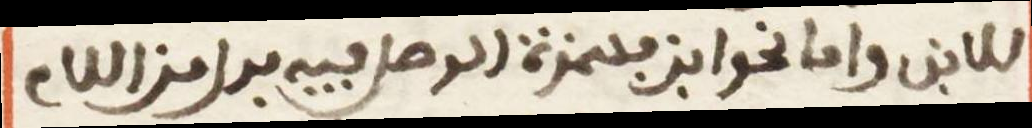للابن واما نحو ابن فهمزة الوصف فيه بدل من اللام
